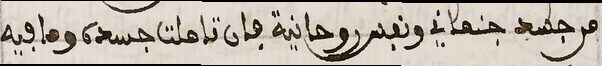من جسد جنماني ونفس روحانية فان تاملت جسده وما فيه
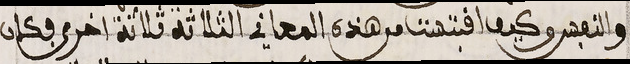والنفس وكيف اقتبست من هذه المعاني الثلاثة ثلاثة اخرى فكان
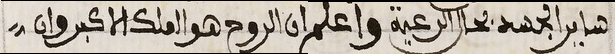ساير الجسد بحال الرعية واعلم ان الروح هو الملك الاكبر وان
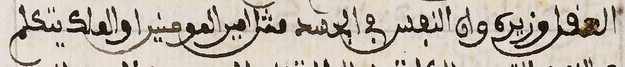العقل وزيره وان النفس في الجسد مثل امير المومنين والملك يتكلم
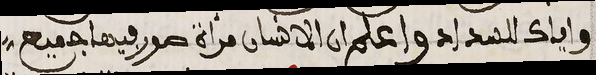واياك للسداد واعلم ان الانسان مرأة صور فيها جميع
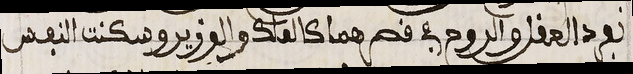نفرد العقل والروح في قصرهما كالملك والوزير سكنت النفس
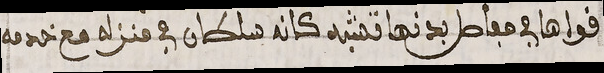قواها في مفاصل بدنها تشبه كانه سلطان في منزله مع خدمه
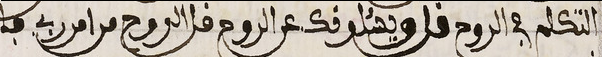التكلم في الروح قل ويسئلونك عن الروح قل الروح من امر ربي فا
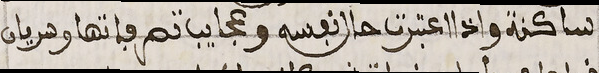ساكنة واذا اعتبرت حال نفسه وعجايب تصرفاتها وسريان
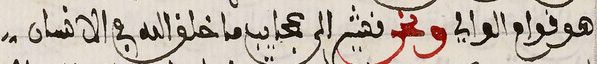هو قوام الوالي ونحن نشير الى عجايب ما خلق الله في الانسان
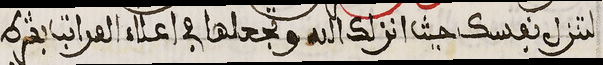لتنزل نفسك حيث انزلك الله وتجعلها في اعلاء المراتب بشرط
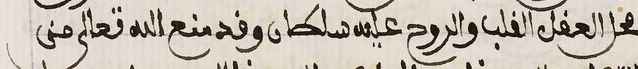محل العقل القلب والروح عليه سلطان وقد منع الله تعالى من
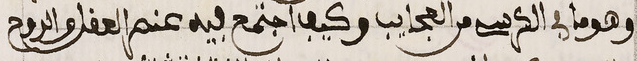وهو ما في الكرسى من العجايب وكيف اجتمع فيه عنصر العقل والروح
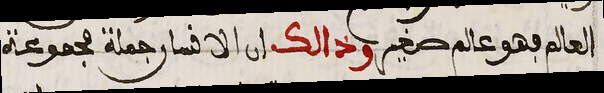العالم فهو عالم صغير وذالك ان الانسان جملة مجموعة
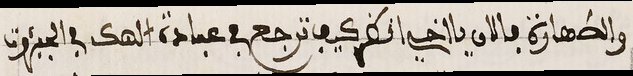والطهارة فالان يا اخي انظر كيف ترجع في عبادة الهك في الجبرؤت
